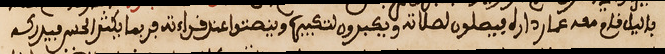باليل قام معه عمار داره فيصلون لصلاته ويكبرون لتكبيره وينصتوا عند قراءته فربما يكثر الحس فيدركه
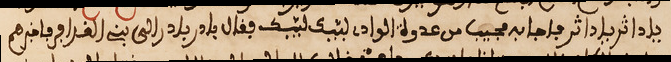يادا ثريا داثر فاجابه مجيب من عدوة الوادى لبيك لبيك فقال بادر بادر الى بنى القرافر فاخبرهم
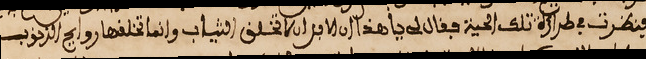فنظرت في طرارة تلك الحية فقال لى يا هذا ان الابن ان لا تخلق الثياب وانما تخلقها روايح الزنوب
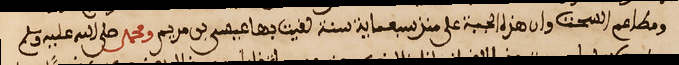ومطاعم السحت وان هذه الجبة على منذ سبعماية سنة لقيت بها عيسى بن مريم ومحمد صلى الله عليه وسلم
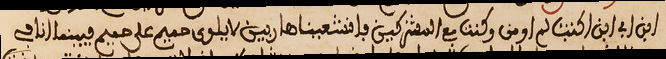ابن ابى ابن الكتب لم او من وكتب مع المشركين فانشعيناها ربين لايلوى حميم على حميم فيبنما انا في
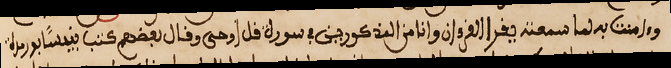وءامنت به لما سمعته يقرا القرءان وانا من المذكورين في سورة قل او حى وقال بعضهم كتب بنيساً بو رمدة
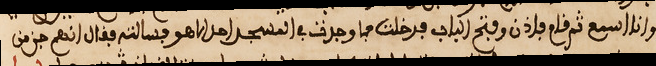وانا اسمع ثم قام فاذن وفتح الباب فرخلت مبا وجدت في المسجد احد الاهو فسالته فقال انهم جن من
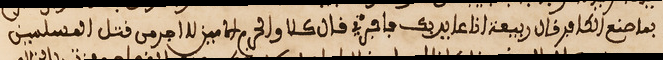بما صنع الكافر قال ربيعة انا عايد بك فافرني قال كلا والحرم الامين لا اجد من قتل المسلمين
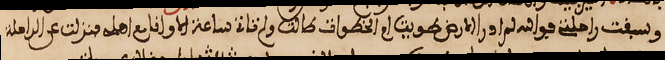وسبقت راحلتى فو الله لم ادرا الارض طويت ام الخطوات طالت ولم تاتى ساعة الاول نامع اهلى فنزلت عن الراحلة
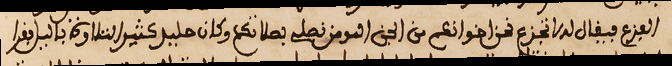الفزع فيقال له لا تجزع نحن اخو انكم من الجن المومن نصلى بصلاتكم وكان حليد كثير التلاوة باليل فقرا
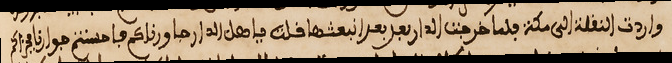واردت النقلة الى مكة فلما خرجت الدار بعد بعد انبعثها قلت يا هل الدار رجا ورناكم فاحستم جوارنا مخيرا كم
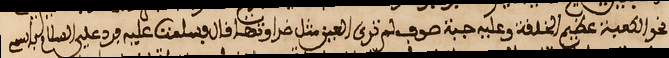نحو الكعبة عظيم الخلقة وعليه جبة صوف لم ترى العين مثل ضرا وتها قال فسلمت عليه فرد علي السلام باسمى
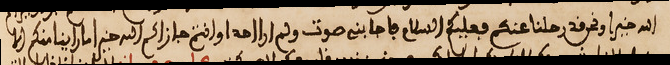الله خير او نحن قد رحلنا عنكم فعليكم السلام فاجابنى صوت ولم ارا احد وانتم جازاكم الله خير اما راينا منكم الا
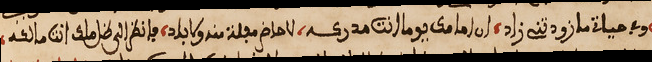وفي حياتى ما زود تنى زاد ان امامك يوما انت مدركه لا حاضر مفلة منه ولا باد فانظر الى ظل ملك انت مالكه
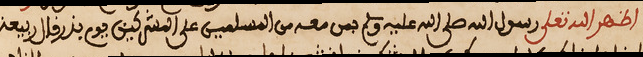اظهر الله تعلى رسول الله صلى الله عليه وسلم بمن معه من المسلمين على المشركين يوم بذر قال ربيعة
